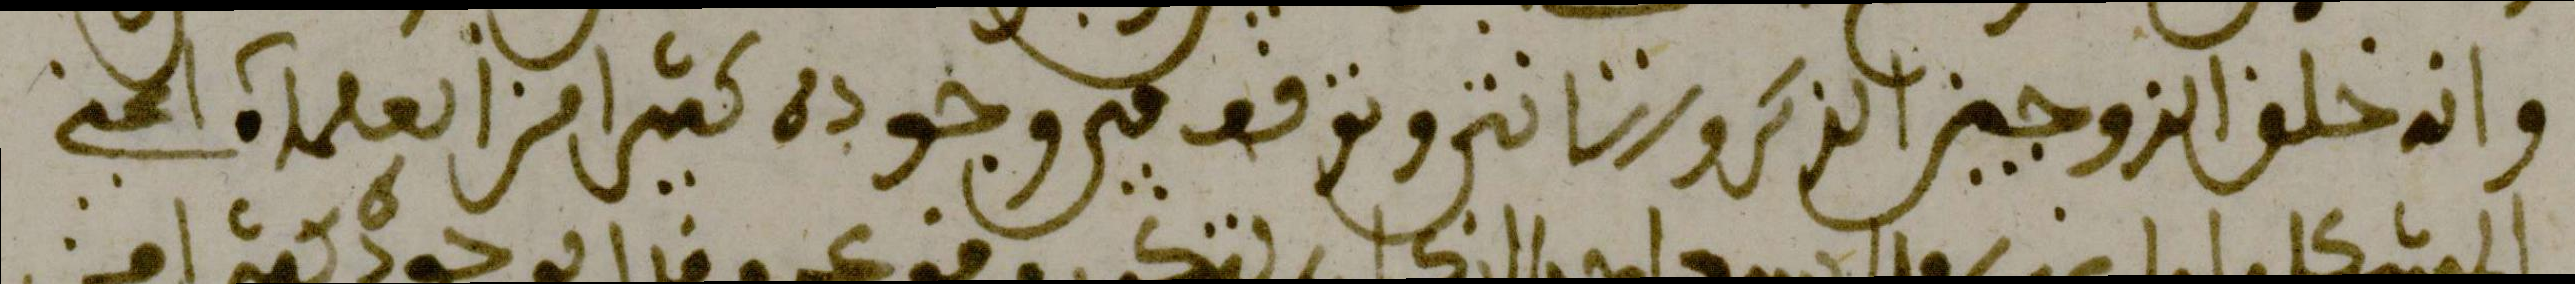وانه خلق الزوجين الذكر والانثى وتوقف في وجوده كثير من العلماء اعني
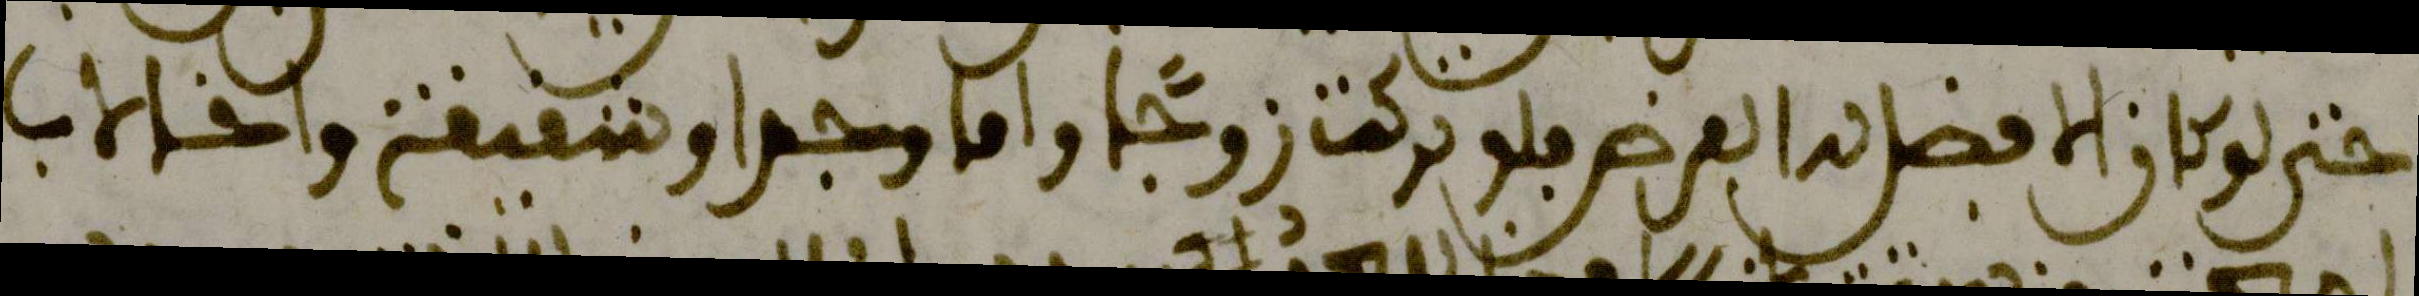حتى لو كان الافضل له الفرض فلو تركت زوجًا واما وجدا وشقيقة واخا لاب
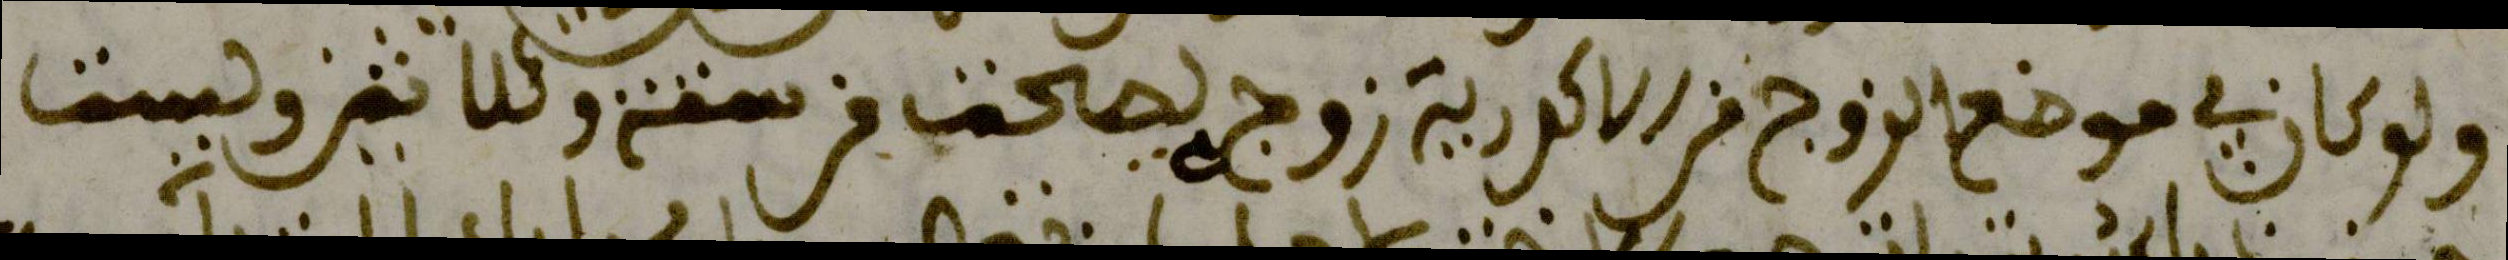ولو كان في موضع الزوج من الاكدرية زوج لصححت من ستة وثلاثين وليست
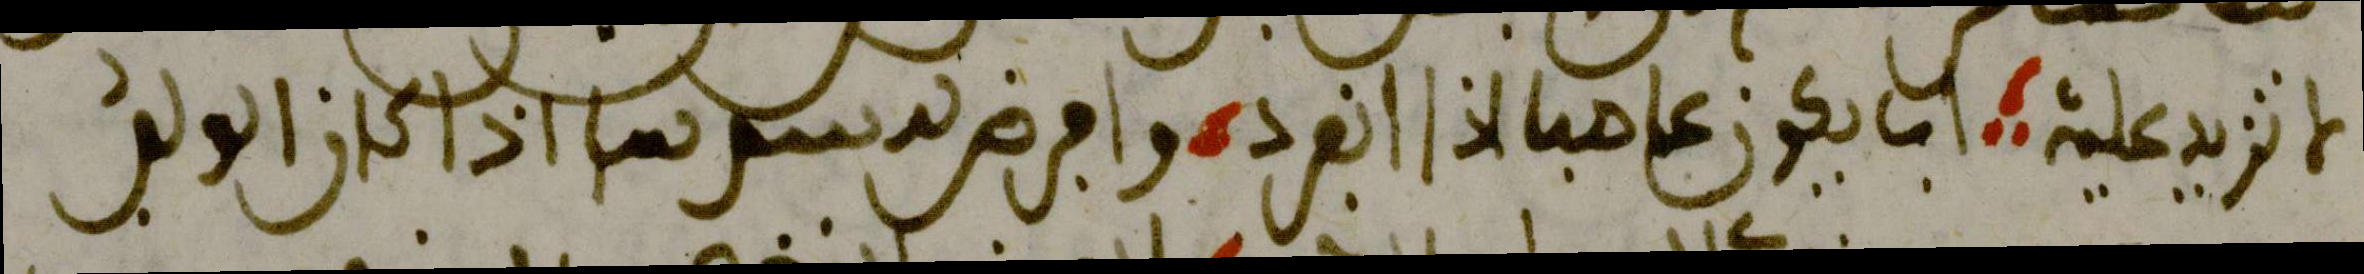لا تزيد عليْه اب يكون عاصلا اذا انفرد وافرض له سدسا اذا كان الولد
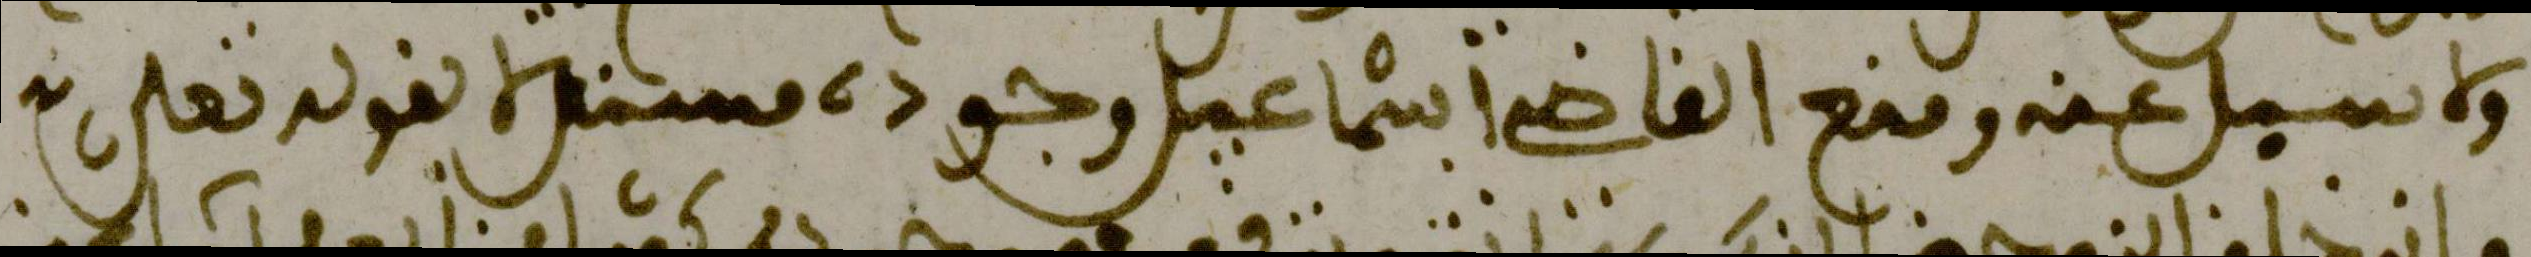ولا سئل عنه ومنع القاضي اسْماعيل وجود مستدلا بقوله تعلى
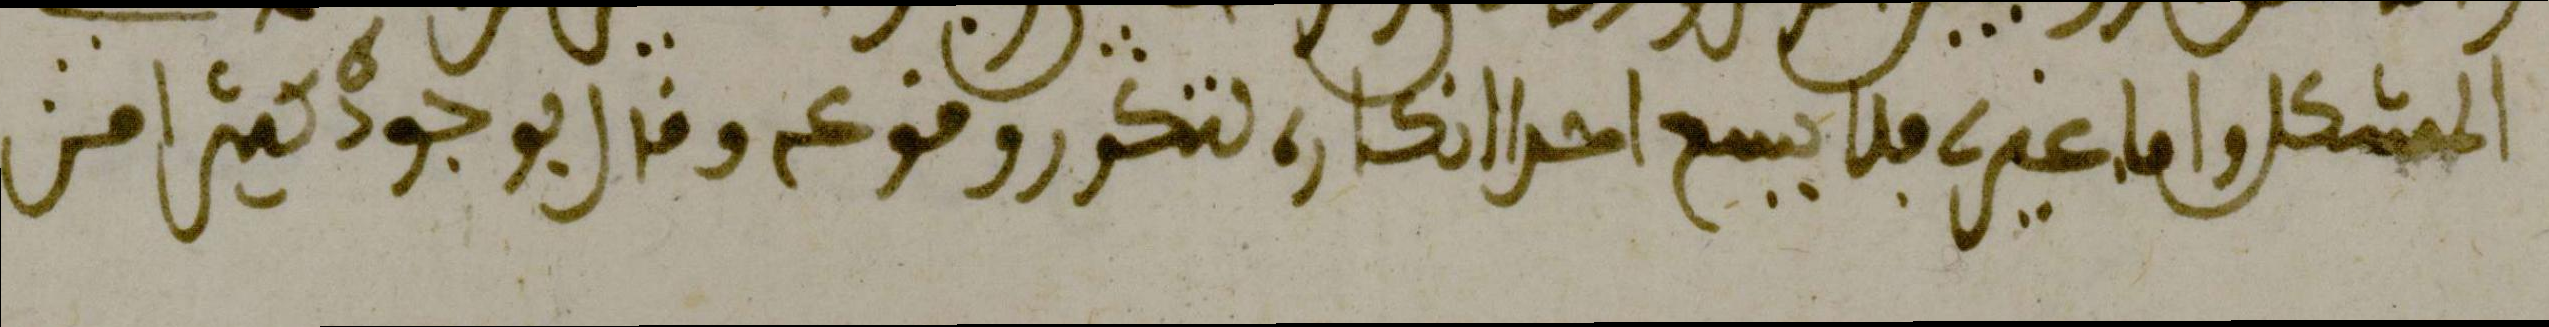المشكل واما غيره فلا يسع احد انكاره لتكرر ووقوعه وقال بوجوده كثير من
